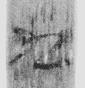九
